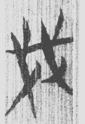戔
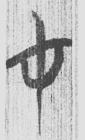才（哉）
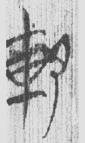𨊠（范）
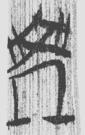{舛亼几}（乘）
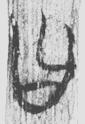曰
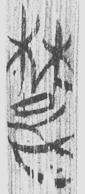楚
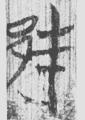邦
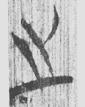之
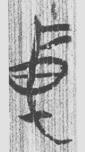𠁩
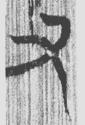又（有）
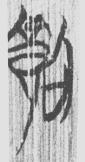{飤口}（飤）
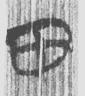田
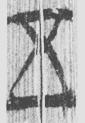五
